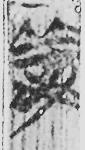義
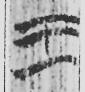王
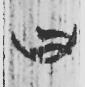曰
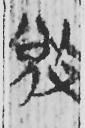敓（說）
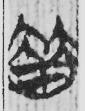昔
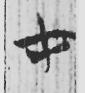在
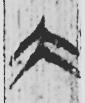大
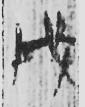戊
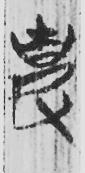尅
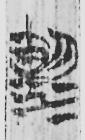{水車刀}
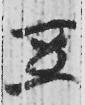五
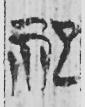祀
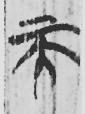天
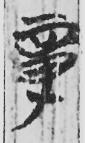章
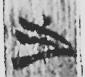之
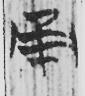甬
